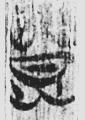莫
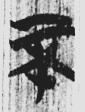不
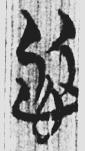忻（欣）
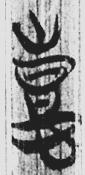憙（喜）
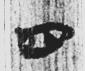四
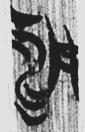海
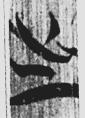之
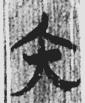內
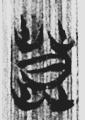莫
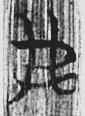弗
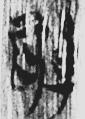○（信）
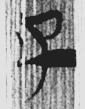子
